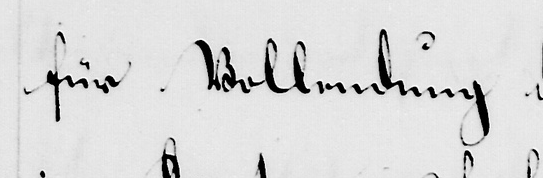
für Vollendung
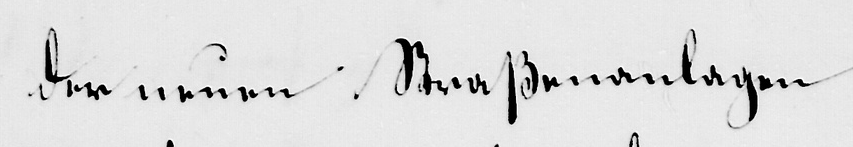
der neuen Straßenanlagen
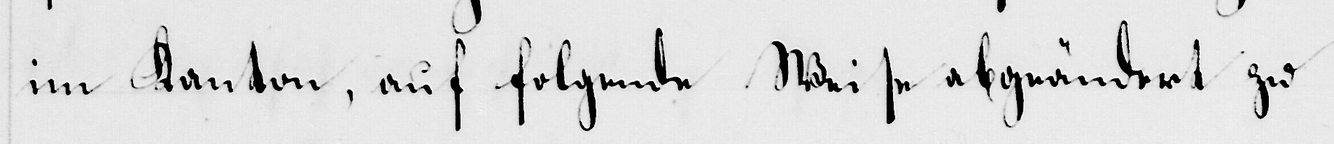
im Kanton, auf folgende Weise abgeändert zu
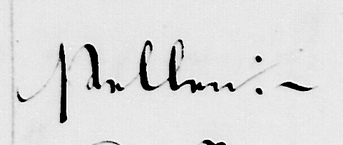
stellen:
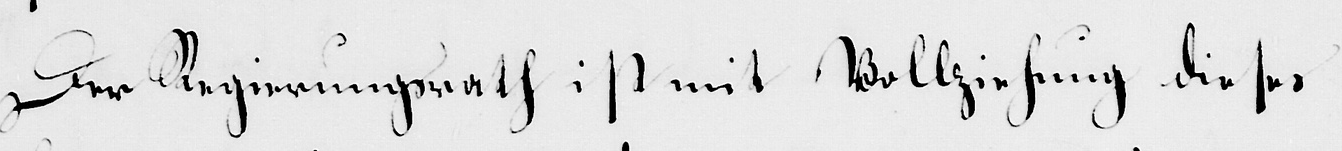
Der Regierungsrath ist mit Vollziehung dieses
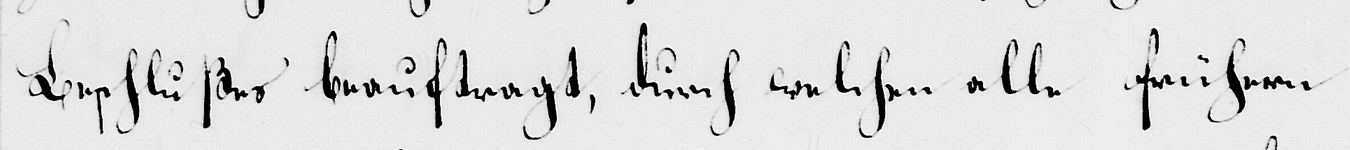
Beschlußes beauftragt, durch welchen alle frühern
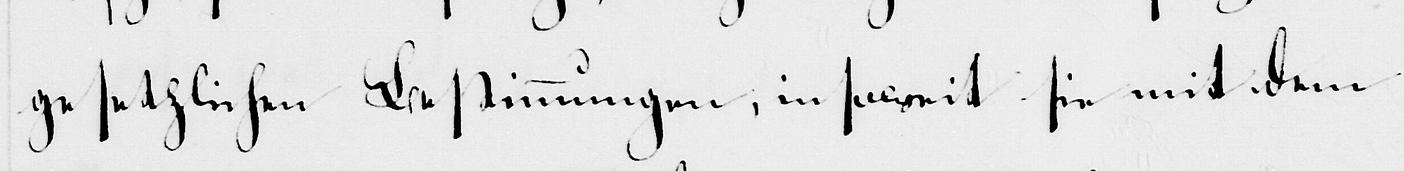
gesetzlichen Bestimmungen, insoweit sie mit dem
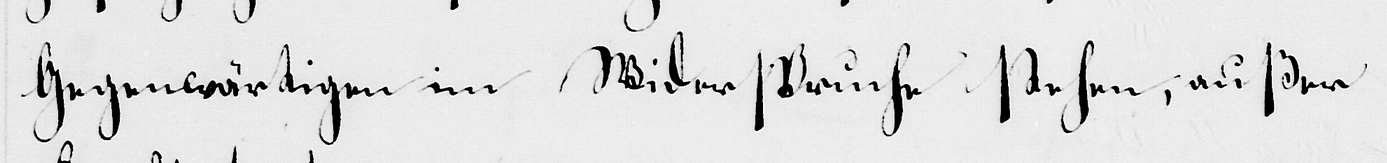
Gegenwärtigen im Widerspruche stehen, außer
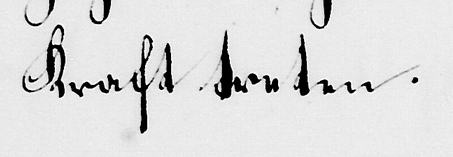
Kraft treten.
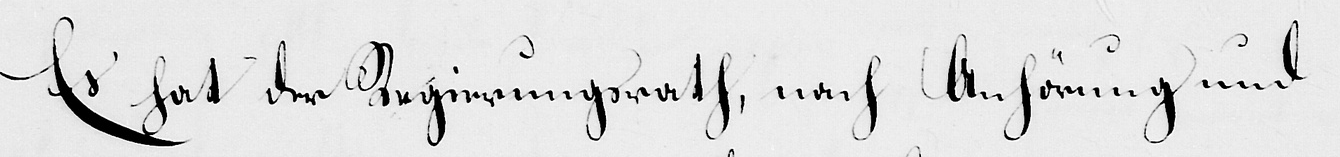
Es hat der Regierungsrath, nach Anhörung und
